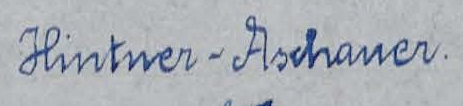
Hintner-Aschauer
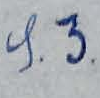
S. 3.
